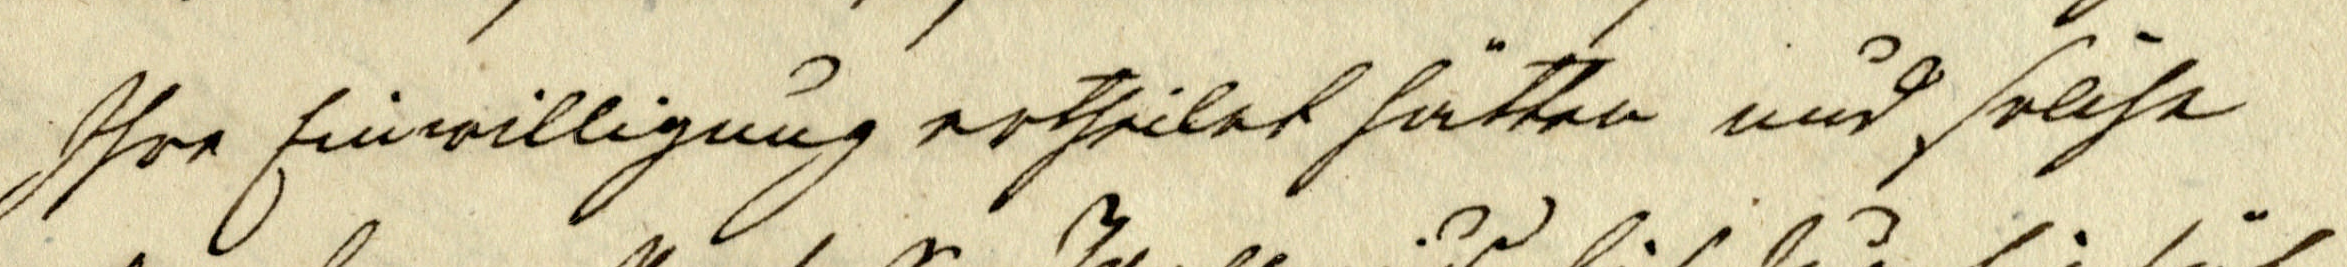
ihre Einwilligung ertheilet hätten und solche
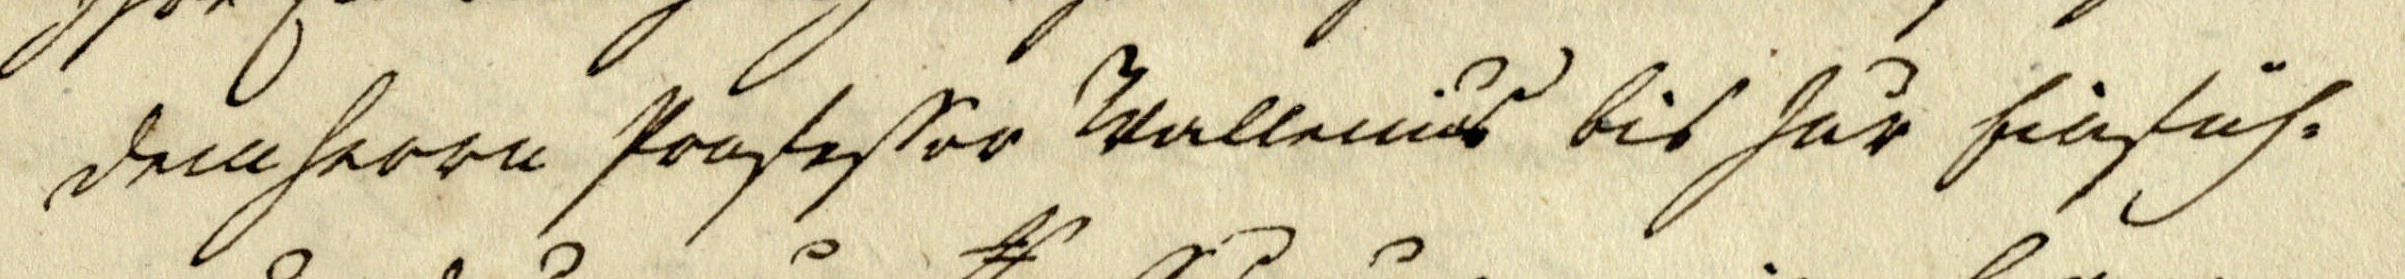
dem Herrn Professor Wallenius bis zur Einfüh¬
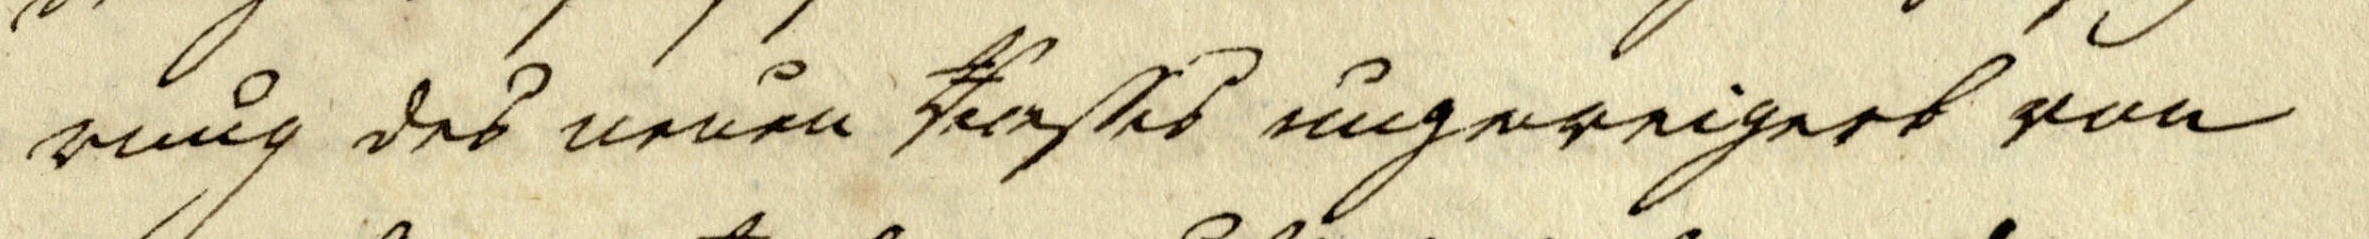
rung des neuen Recesses ungeweigert von
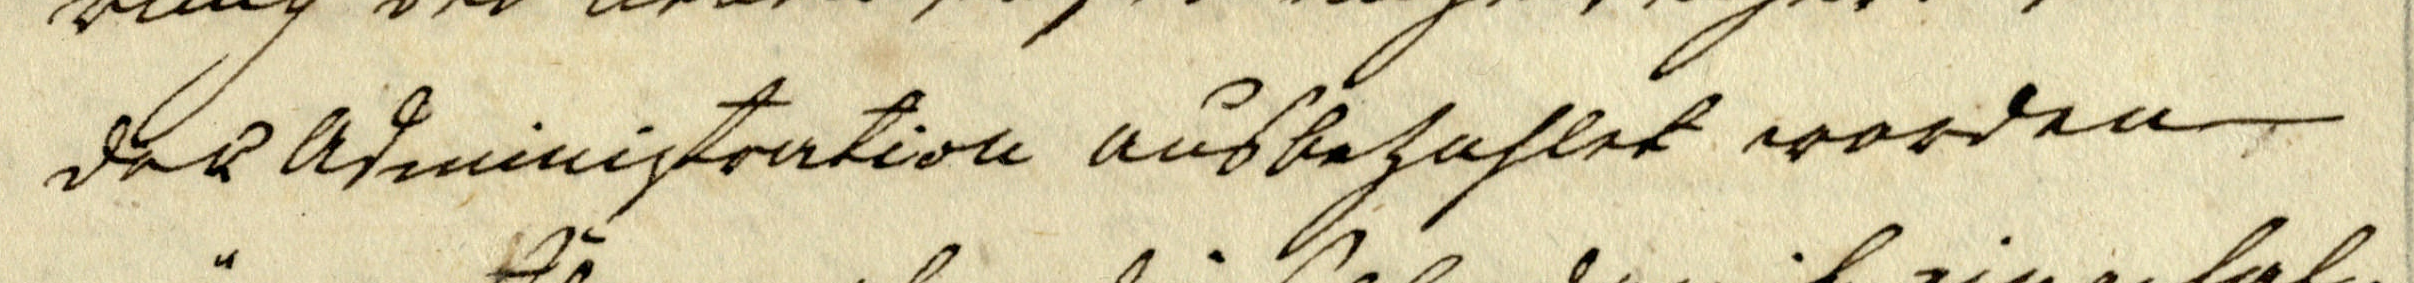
der Administration ausbezahlet worden
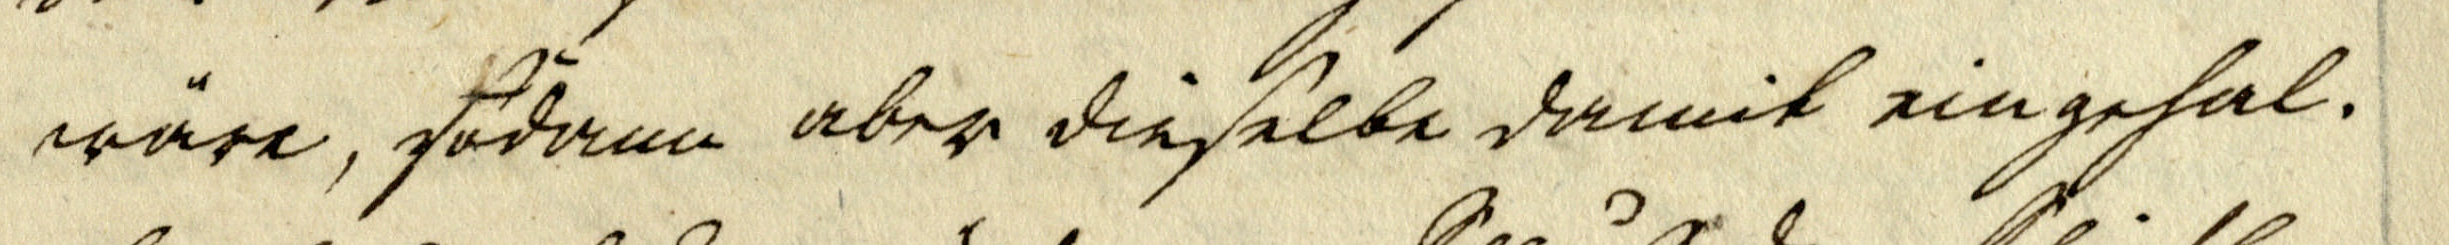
wäre, sodann aber dieselbe damit eingehal¬
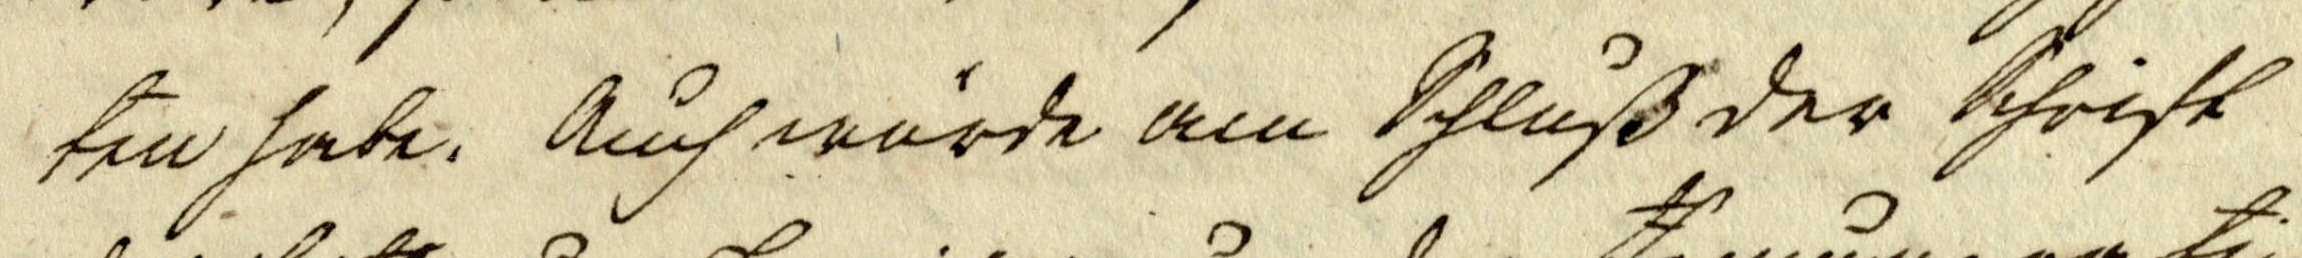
ten habe. Auch würde am Schluß der Schrift
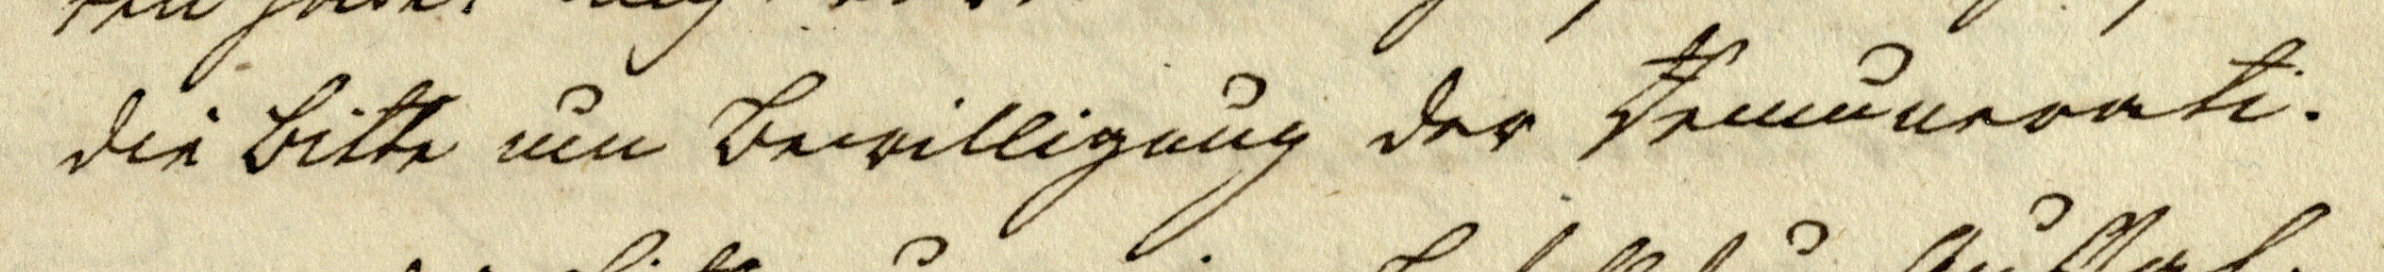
die Bitte um Bewilligung der Remunerati¬
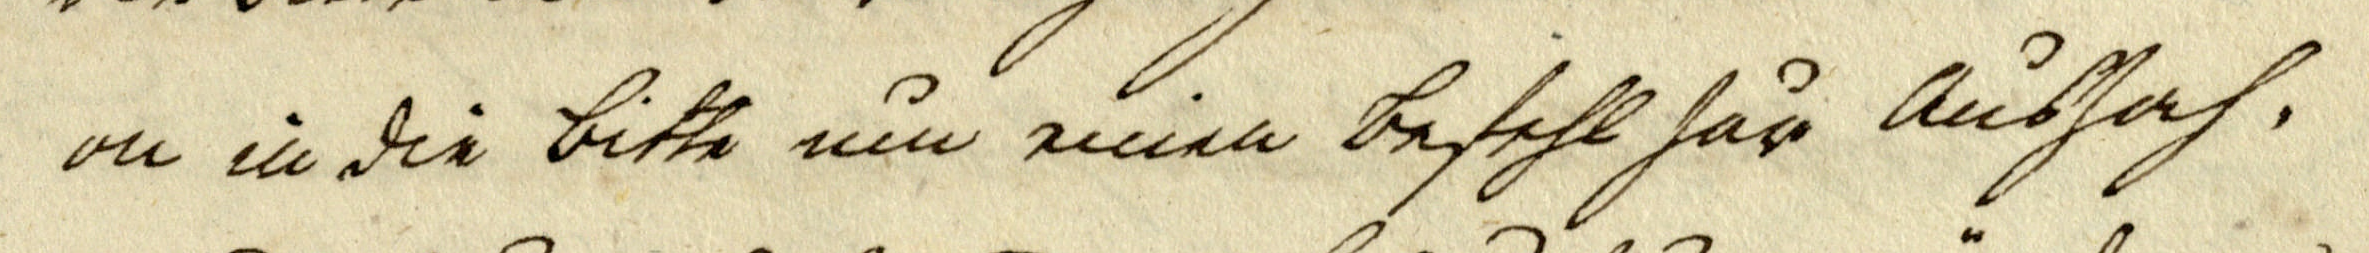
on in die Bitte um einen Befehl zur Auszah¬
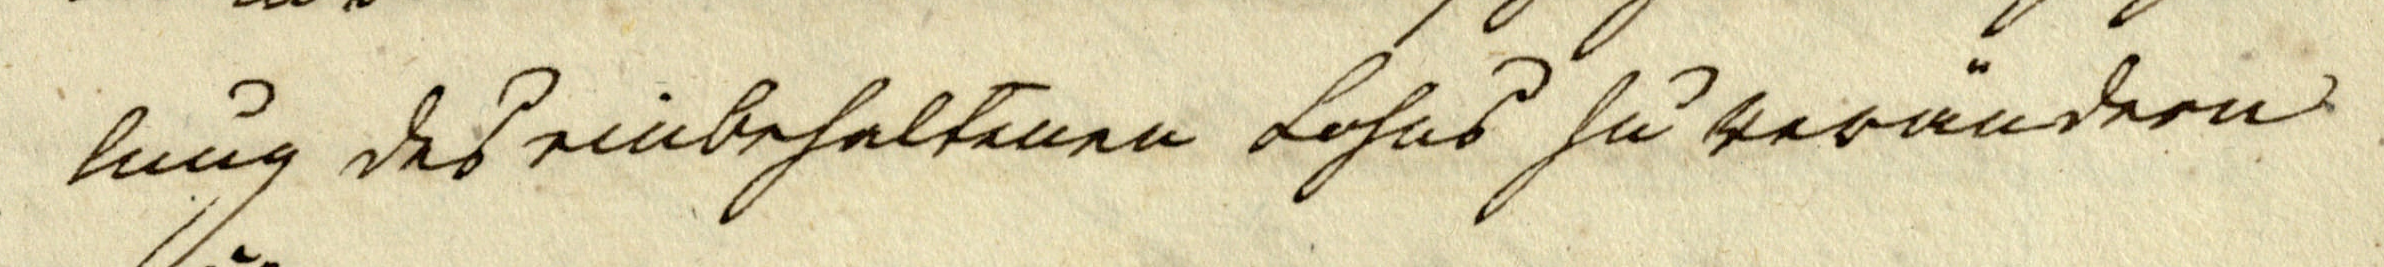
lung des einbehaltenen Lohns zu verändern
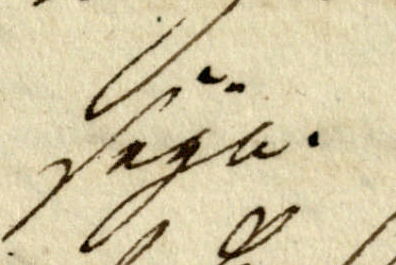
seÿn.
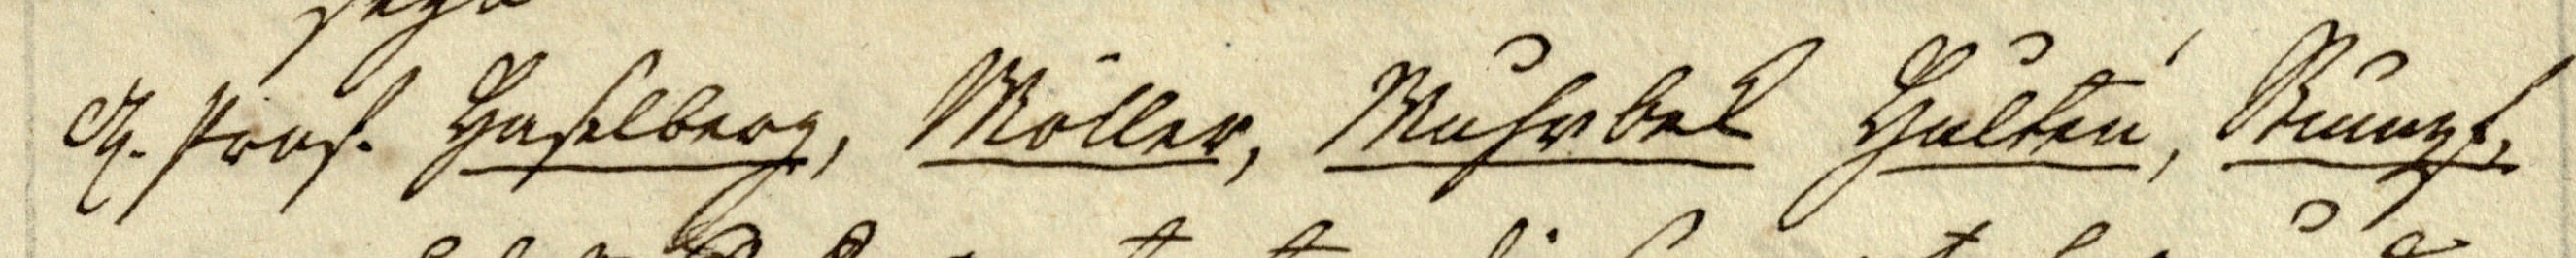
dh. Prof. Haselberg, Möller, Muhrbeck, Hultén, Stumpf
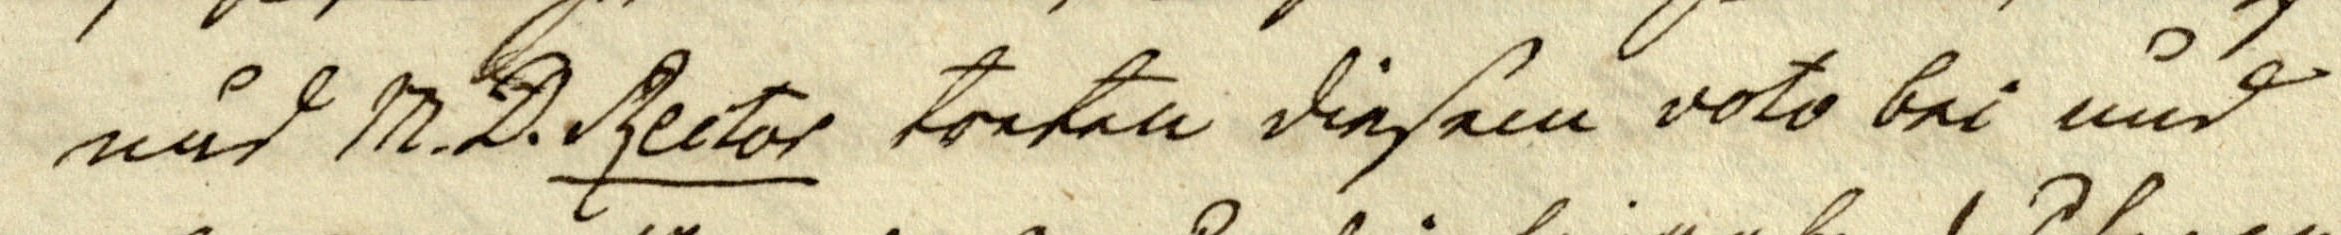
und M D. Rector treten diesem voto bei und
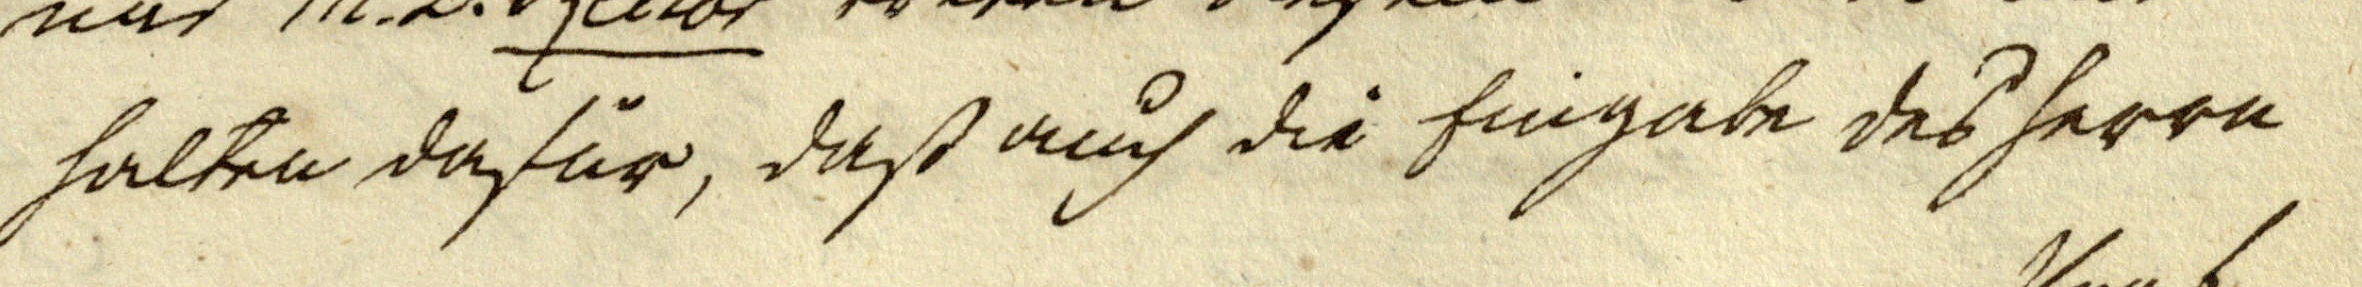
halten dafür, daß auch die Eingabe des Herrn
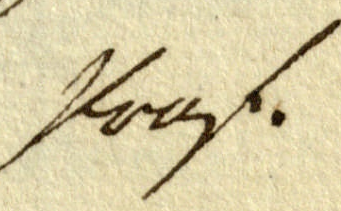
Prof.
